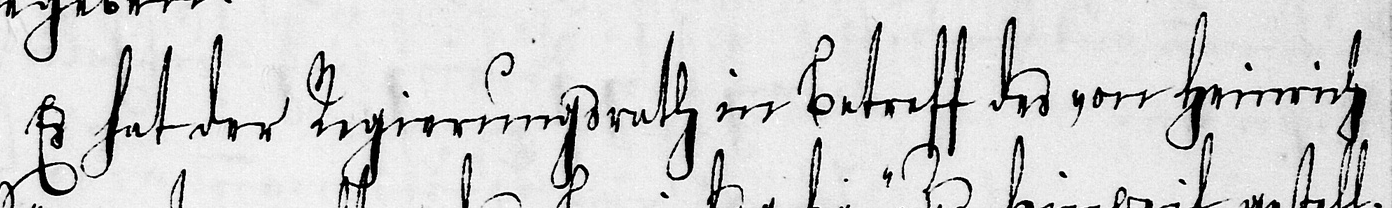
Es hat der Regierungsrath in Betreff des von Heinrich
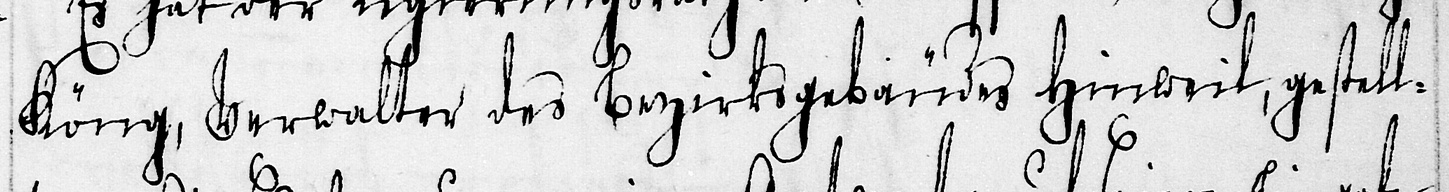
Köng, Verwalter des Bezirksgebäudes Hinweil, gestell¬
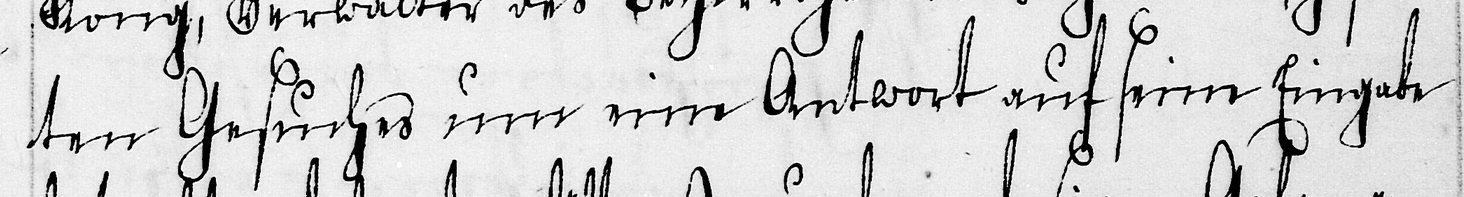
ten Gesuches um eine Antwort auf seine Eingabe
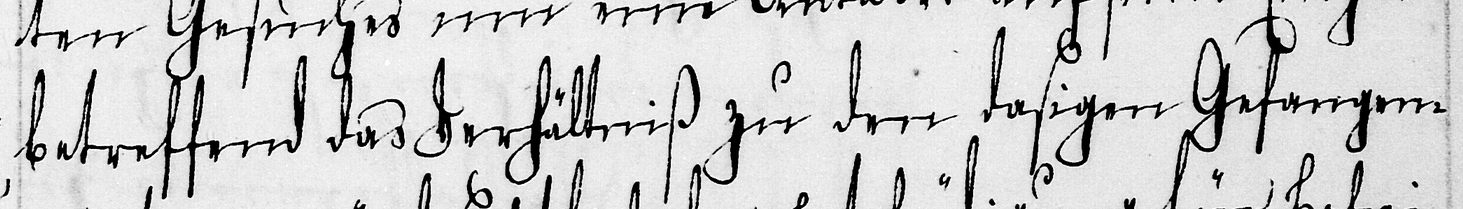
betreffend das Verhältniß zu den dasigen Gefangen¬
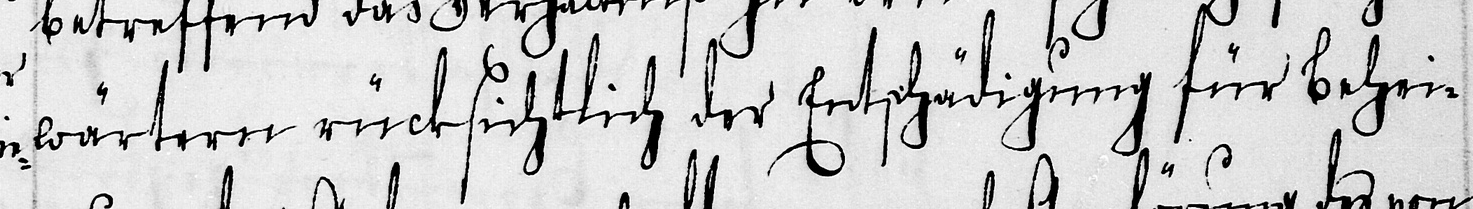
wärtern rücksichtlich der Entschädigung für Behei¬
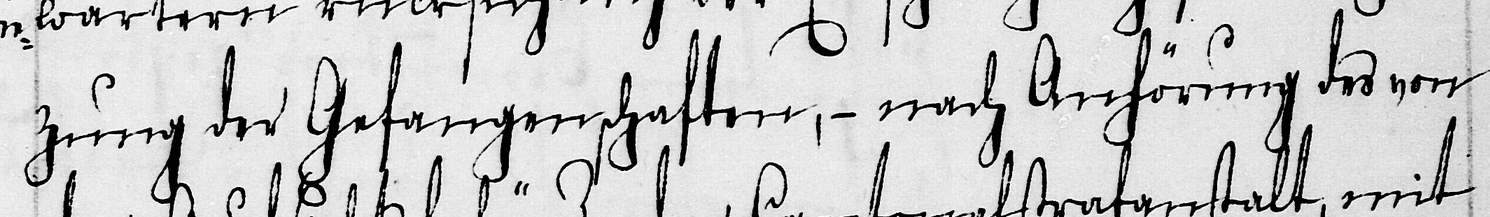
zung der Gefangenschaften, – nach Anhörung des von
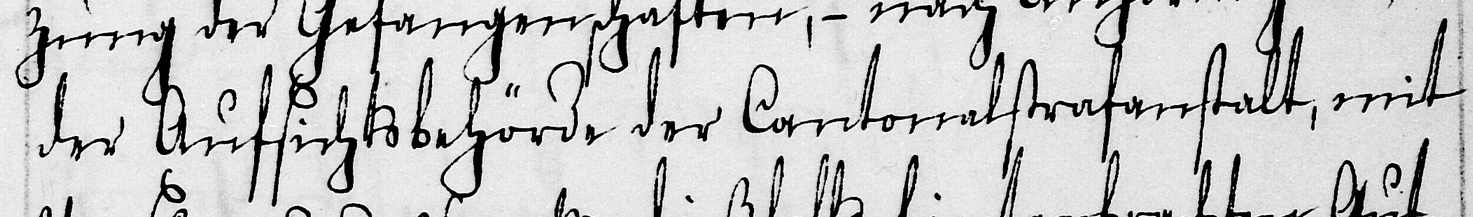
der Aufsichtsbehörde der Cantonalstrafanstalt, mit
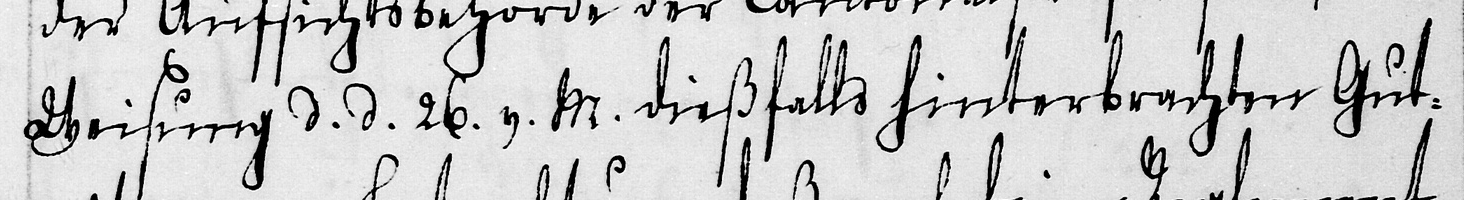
Weisung d. d. 26. v. M. dießfalls hinterbrachten Gut¬
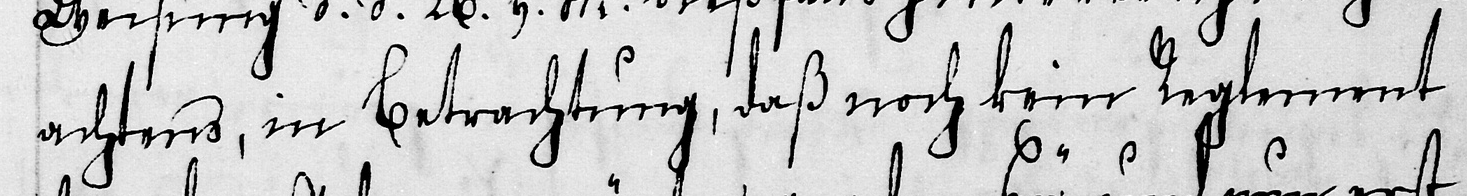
achtens, in Betrachtung, daß noch kein Reglement
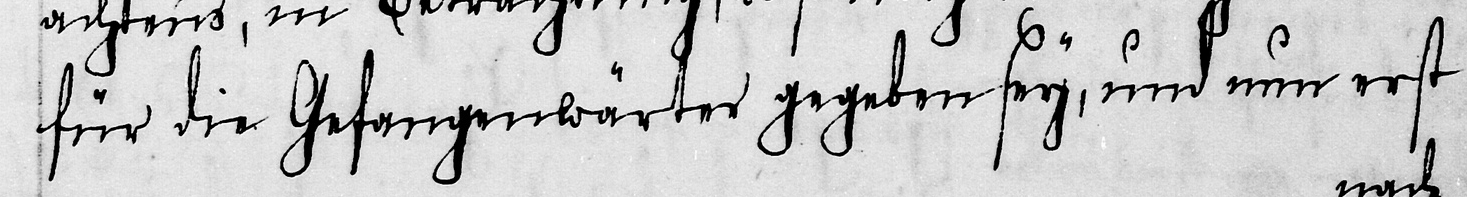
für die Gefangenwärter gegeben sey, und nun erst
